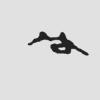冋
